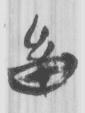畜
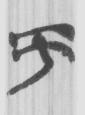于
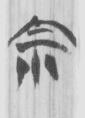宗
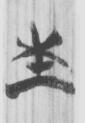{木土}
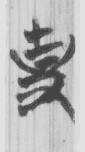吏
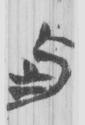此
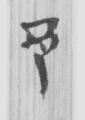邑
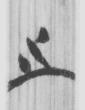之
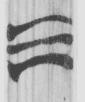三
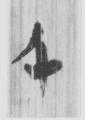千
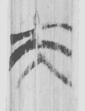夫
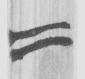二
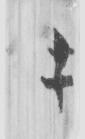{十七}
